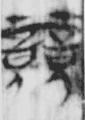競
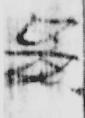快
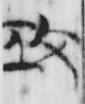攻
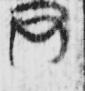尹
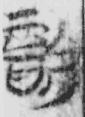○（舒）
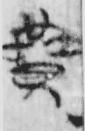賹
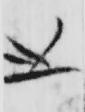之
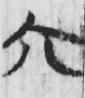六
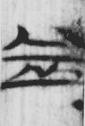益
